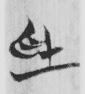{爪土}
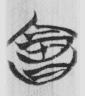會
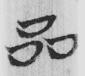厽
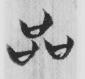品
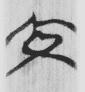交
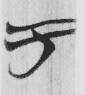于
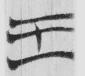王
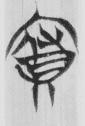{宀付貝}
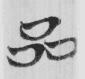厽
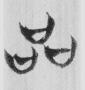品
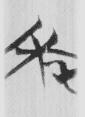年
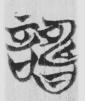{言𠷎}
